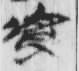且
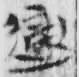歸
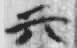亓（其）
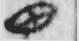田
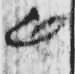㠯（以）
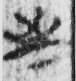至（致）
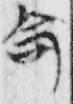命
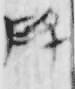阩
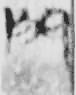門
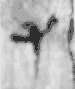又
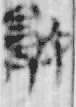敗
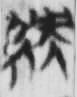紻
